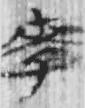李
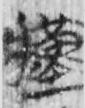瘽
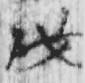戊
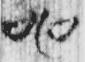申
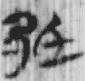邸
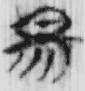昜（陽）
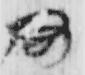君
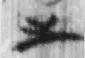之
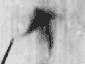人
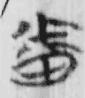番
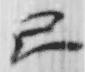己
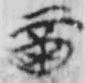酉
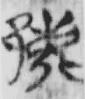鄜
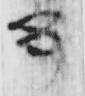邑
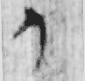人
